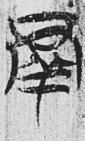羣
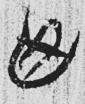臣
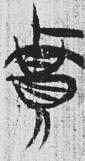貴
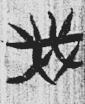戔（賤）
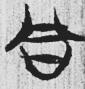同
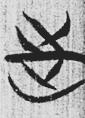○（待）
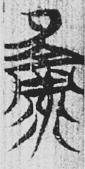录（禄）
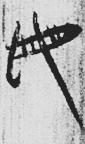母
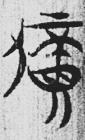○（負）
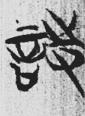詩
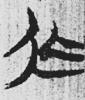於
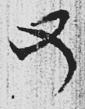又（有）
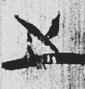之
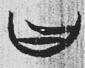曰
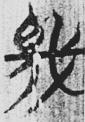幾（豈）
